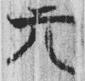亓（其）
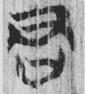君
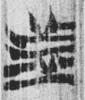者
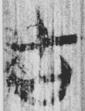古（故）
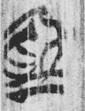爲
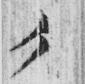人
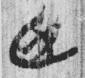臣
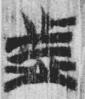者
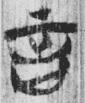言
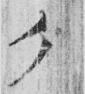人
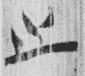之
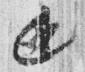臣
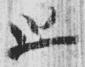之
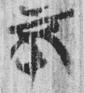不
